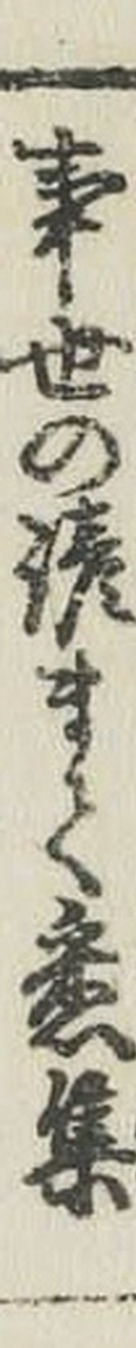事世の諺まて悉集
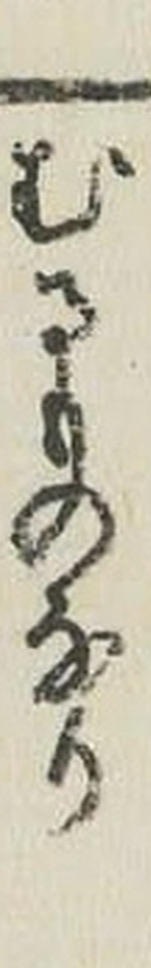むるものなり
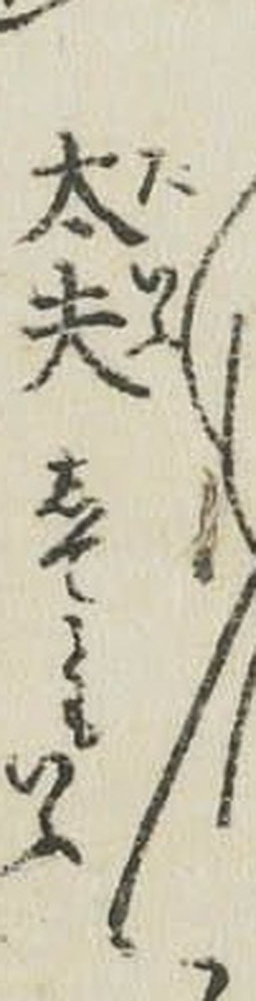太夫してともいふ
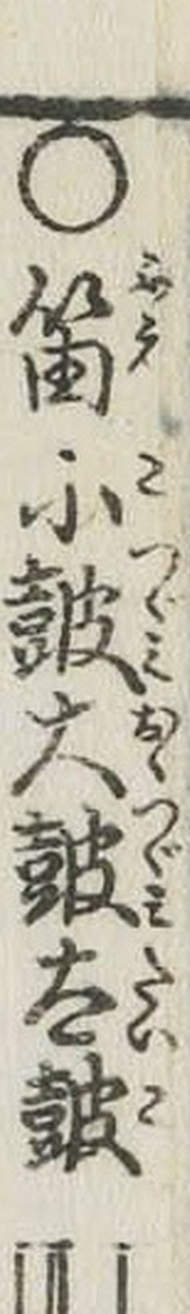○笛小鼓大鼓太鼓
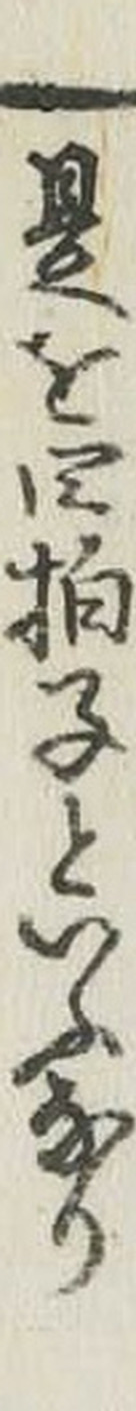是を四拍子といふなり
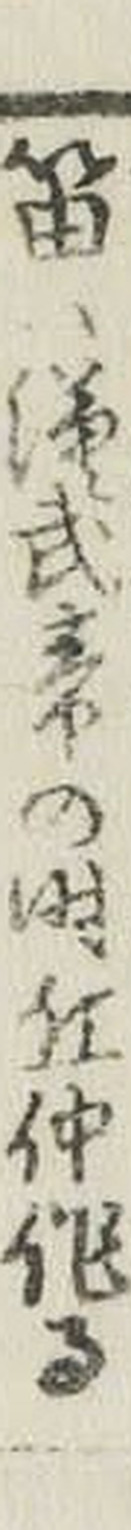笛は漢武帝の時丘仲作る
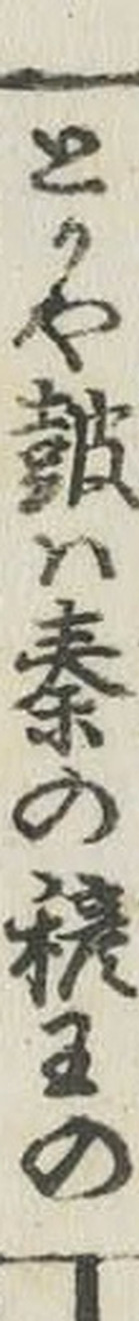とかや鼓は秦の穆王の
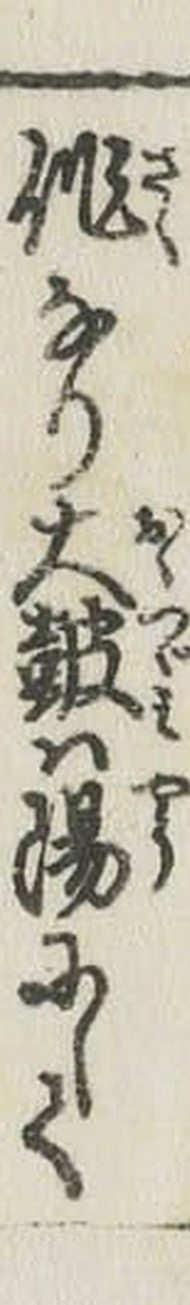作なり大鼓は陽にして
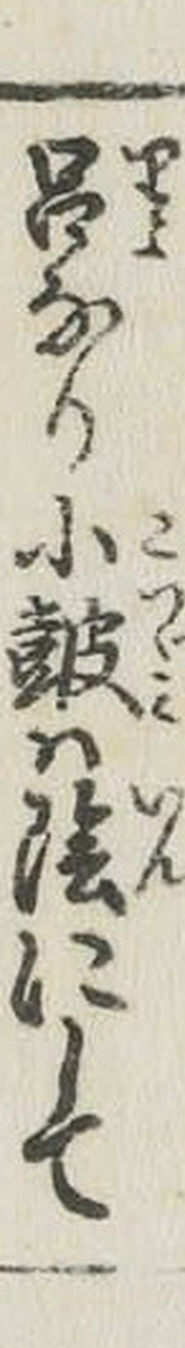呂なり小鼓は陰にして
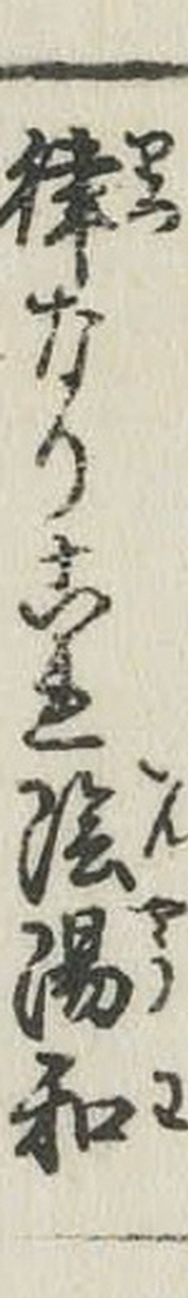律なりこれ陰陽和
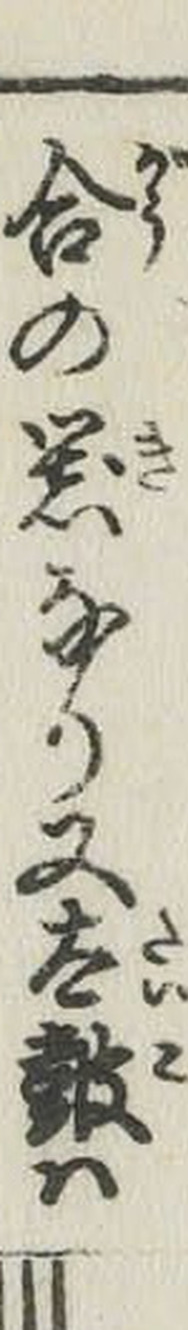合の器なり又太鼓は
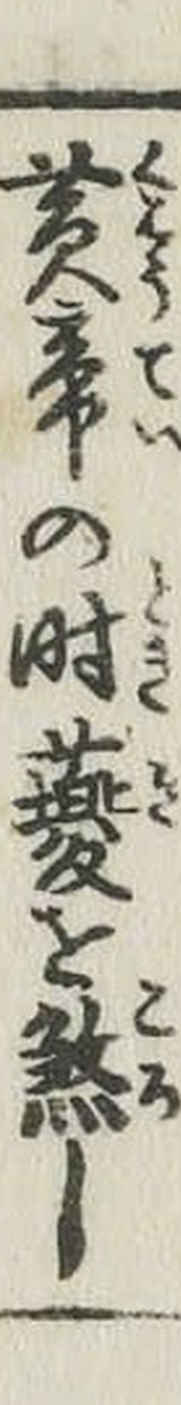黄帝の時䕫を煞し
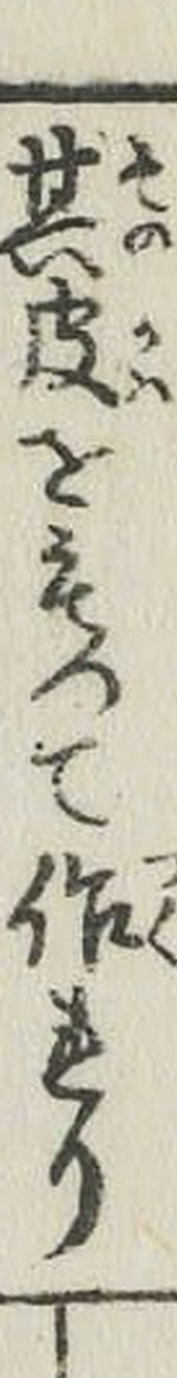其皮をもつて作れり
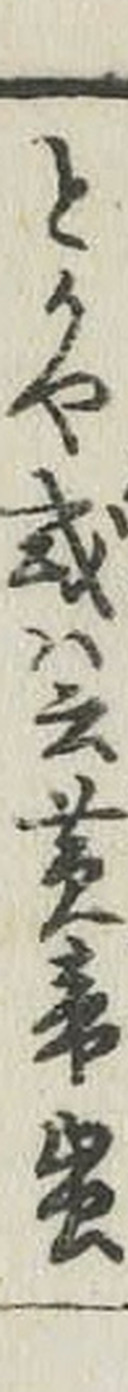とかや或は云黄帝蚩
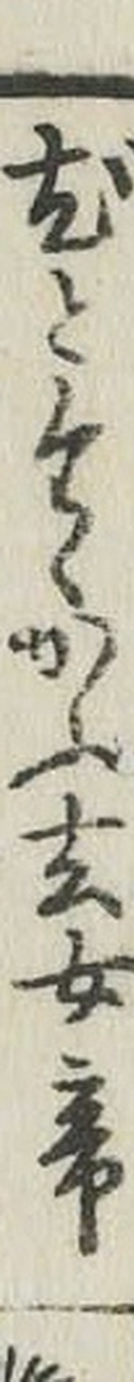尤とたゝかふ玄女帝
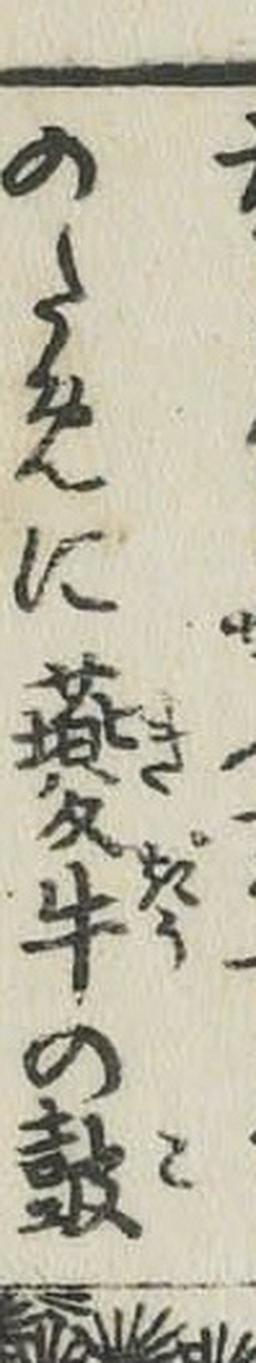のために䕫牛の鼓
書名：増補頭書訓蒙図彙大成 10巻 10:巻之21
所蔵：東京学芸大学教育コンテンツアーカイブ
